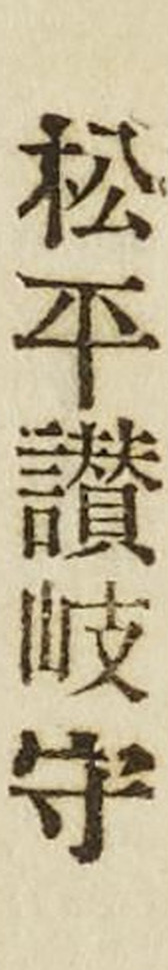松平讃岐守
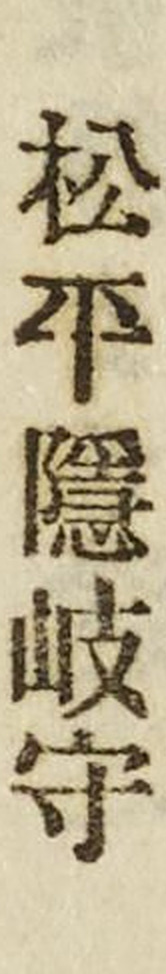松平隠岐守
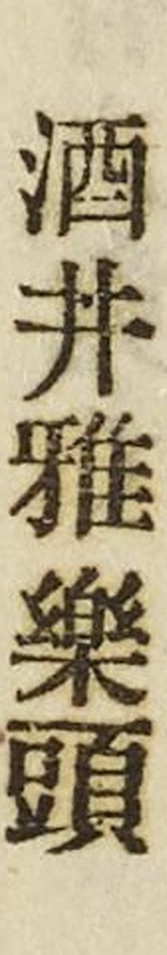酒井雅樂頭
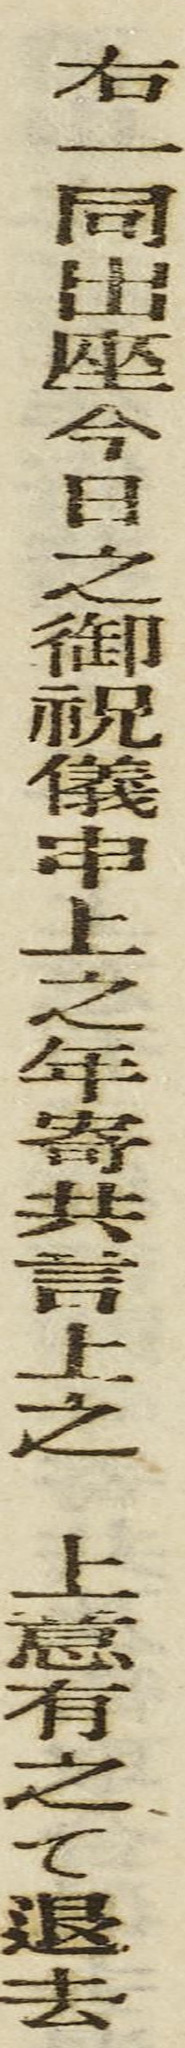右一同出座今日之御祝儀申上之年寄共言上之上意有之て退去
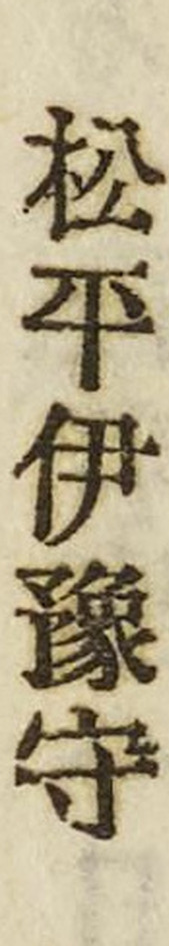松平伊予守
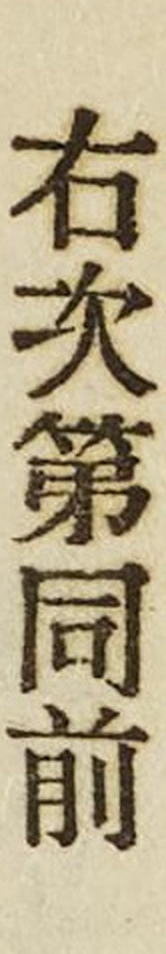右次第同前
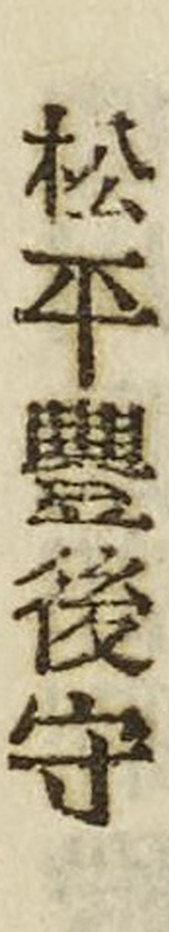松平肥後守
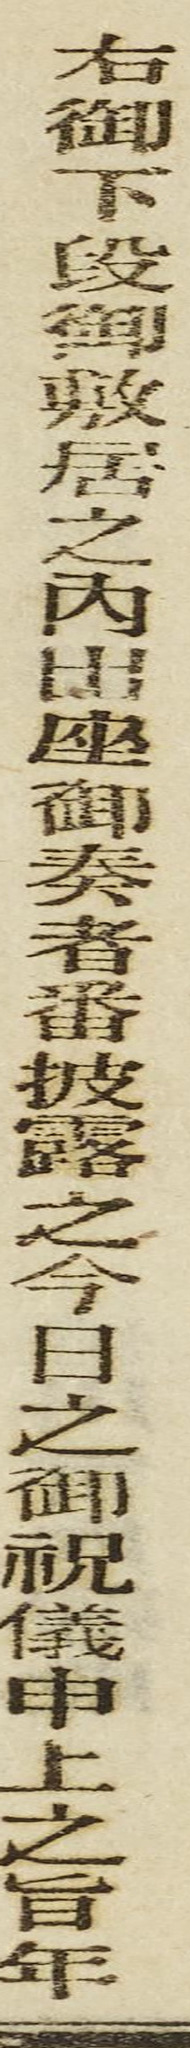右御下段敷居之内出座御奏者番披露之今日之御祝儀申上之旨年
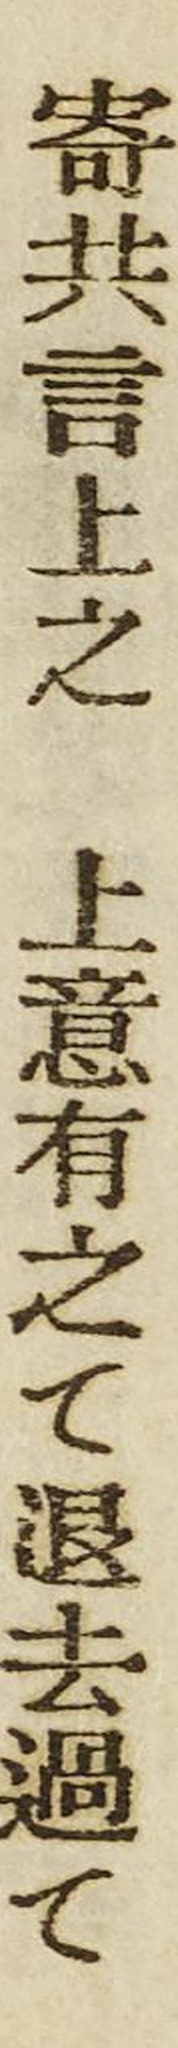寄共言上之上意有之て退去過て
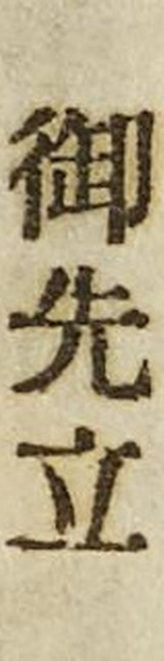御先立

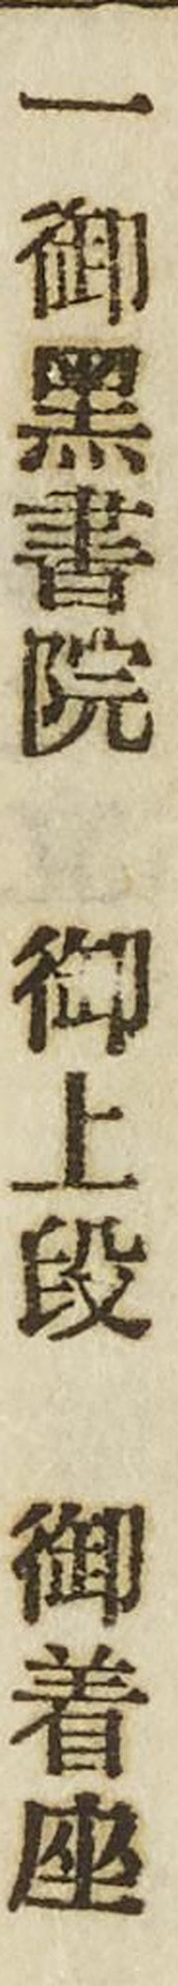一御黒書院御上段御着座
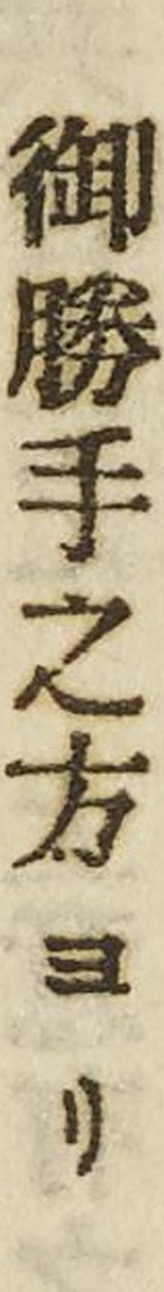御勝手之方ヨリ
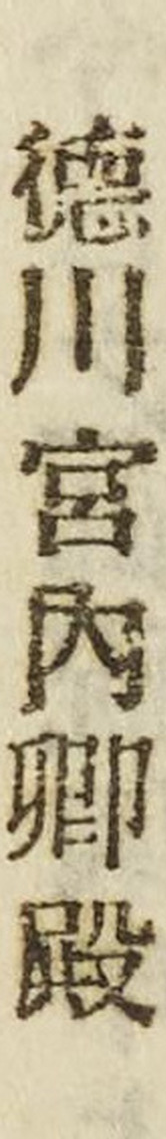徳川宮内卿殿
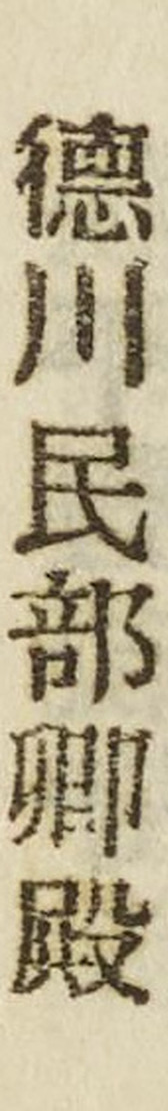徳川民部卿殿
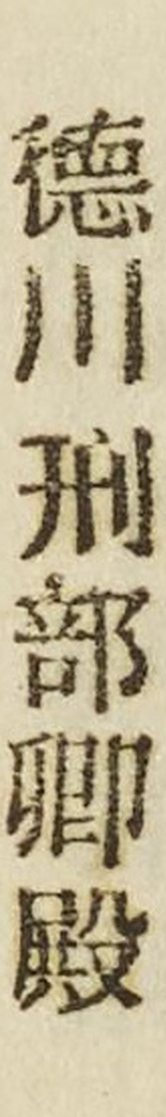徳川刑部卿殿
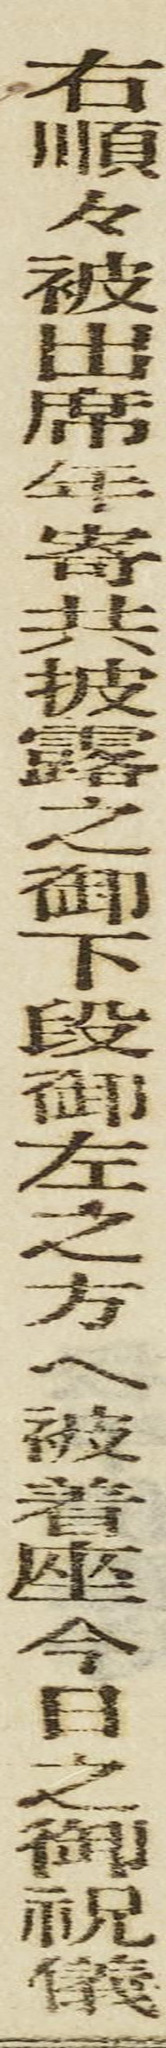右順々被出席年寄共披露之御下段御左之方へ被着座今日之御祝儀
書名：史籍集覽　朝鮮陣古文・細井廣澤記・颶風紀事・天明七年將軍宣下次第書　全
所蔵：東京大学地震研究所図書室 Earthquake Research Institute Library, The University of Tokyo, JAPAN
